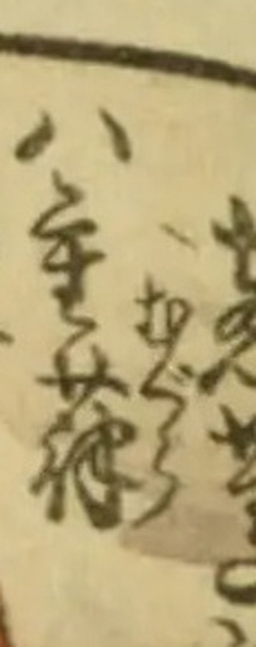八重葎
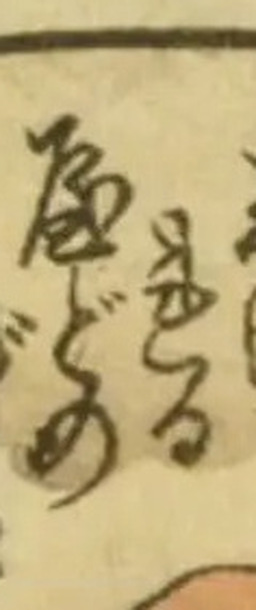屋どの
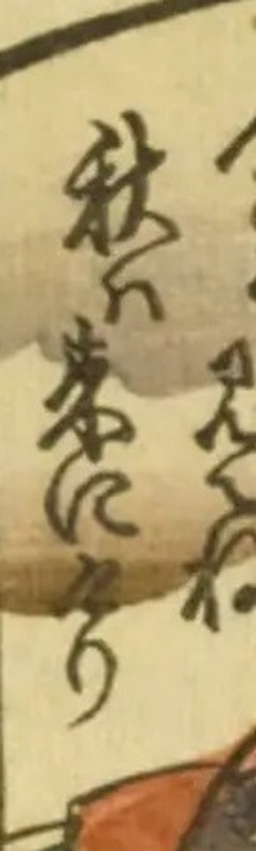秋は来にけり
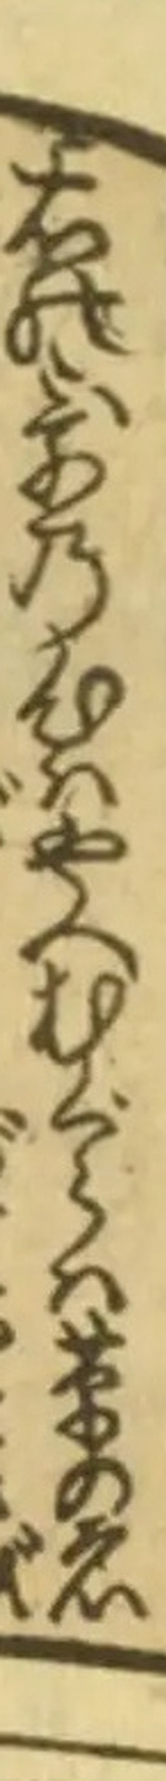右の哥の心はやへむぐらは草の名
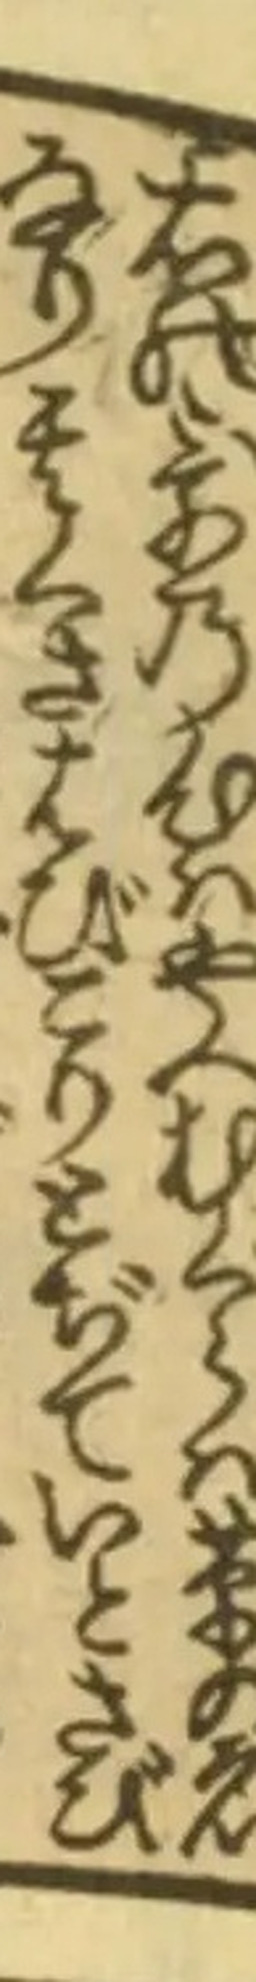なり其くさはびこりとぢていとさび
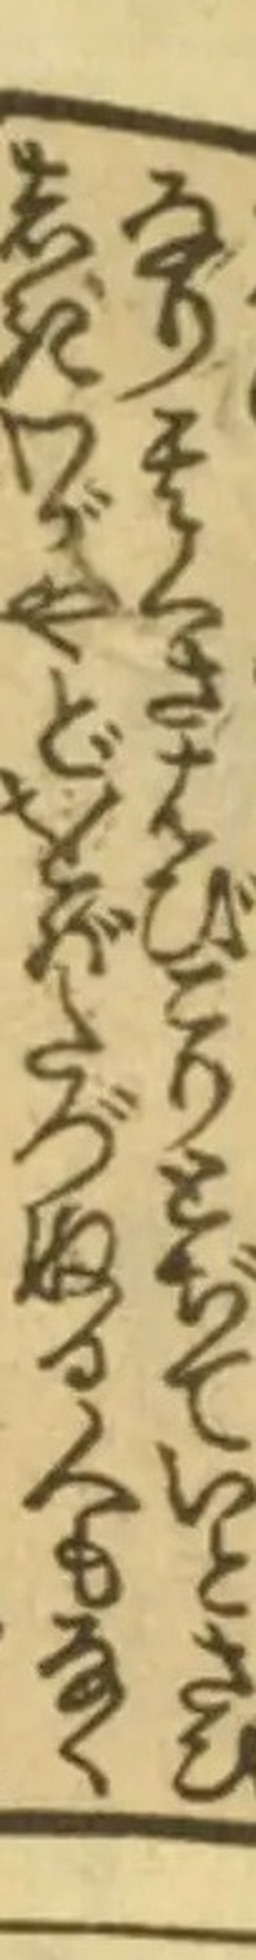しきわがやどをばたづぬる人もなく
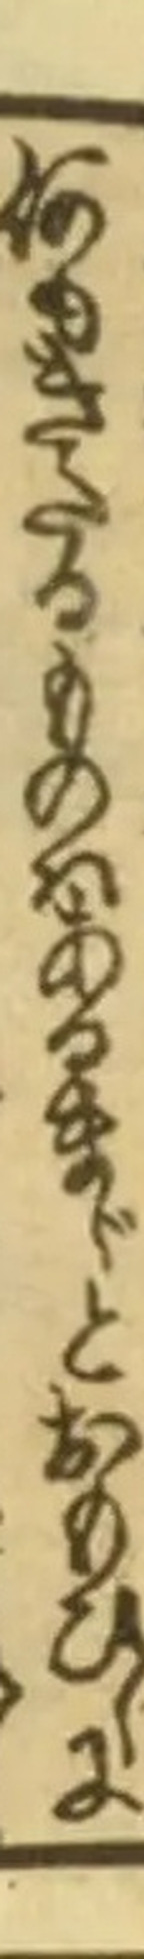何もきたるものはあるまじとおもひしに
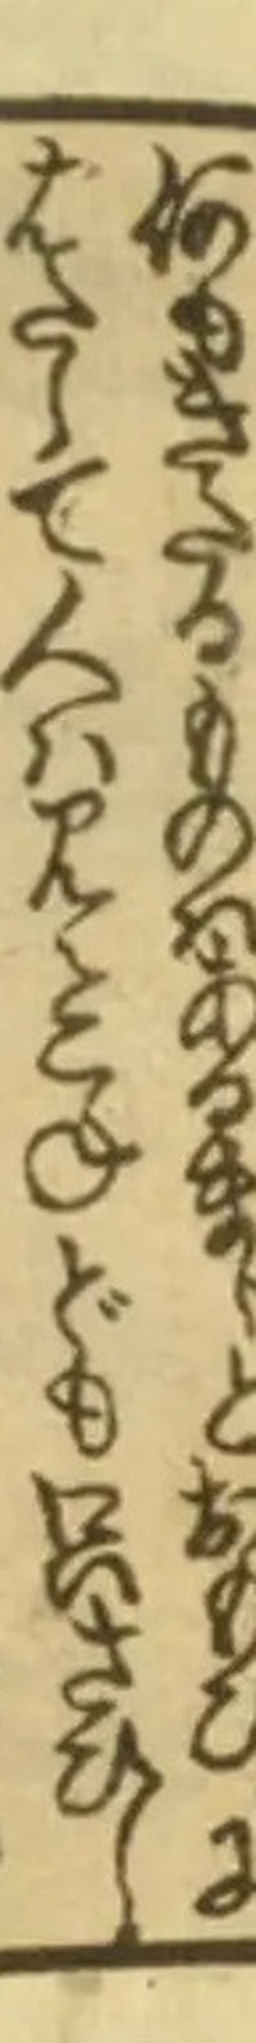はたして人は見えねども只さひし
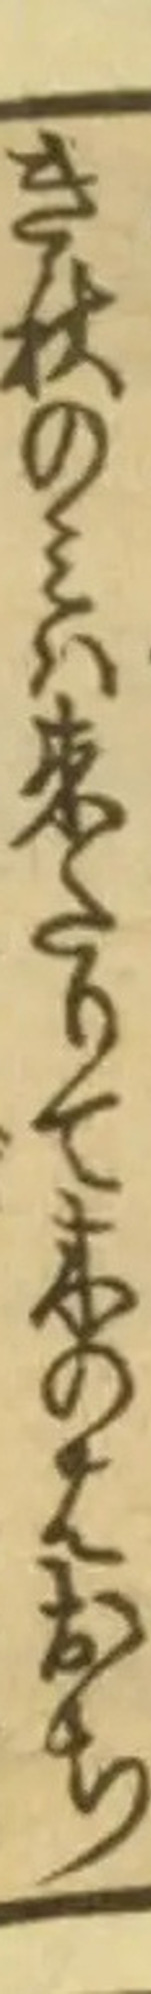き秋のみは来たりて木のはおち
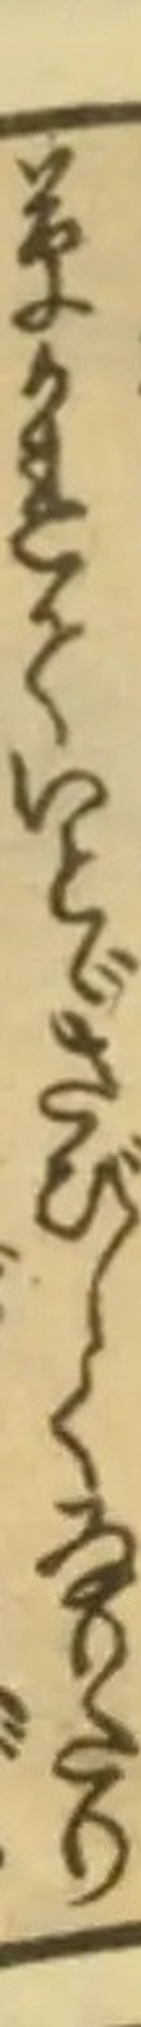草かれていとゞさびしくなりたり
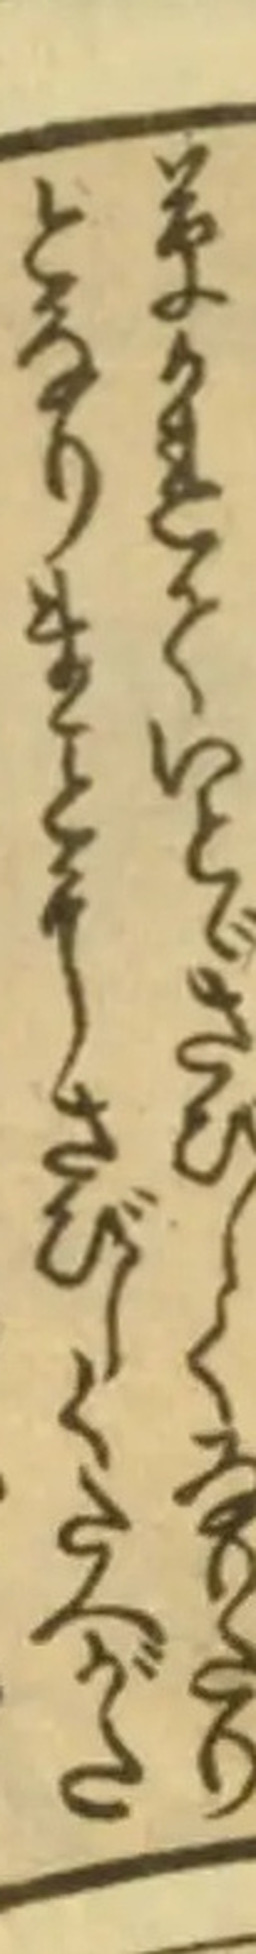となりまことにさびしくたへがた
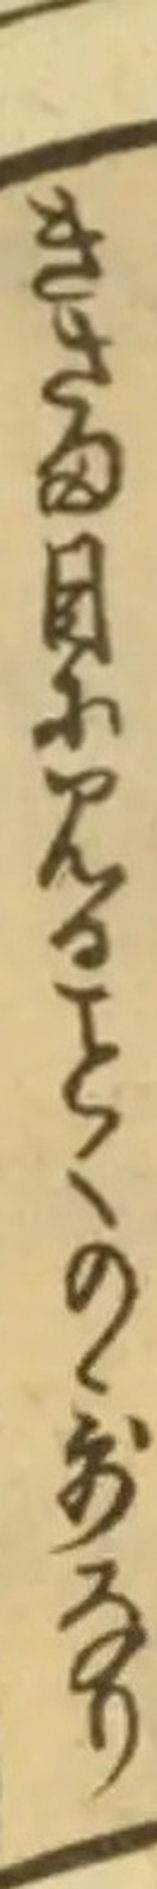きさま目に見ることくの哥なり
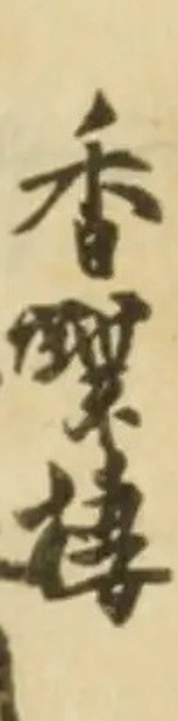香蝶棲
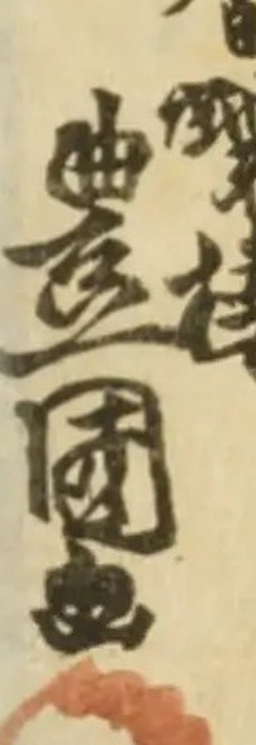豊国画
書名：四十八ばん　恵慶法師
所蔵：国立国会図書館 National Diet Library, JAPAN
